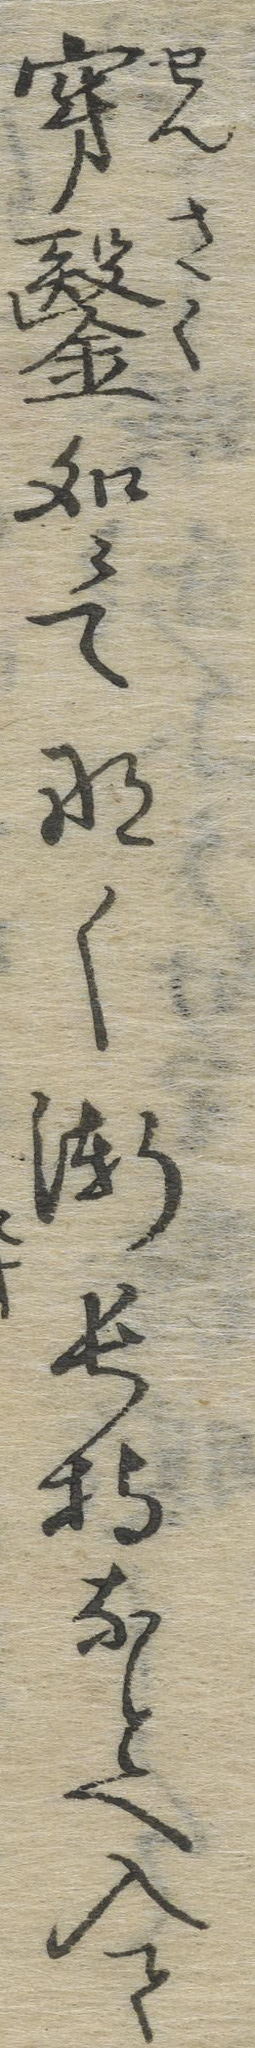穿鑿知らてなく漸長持などへ入て
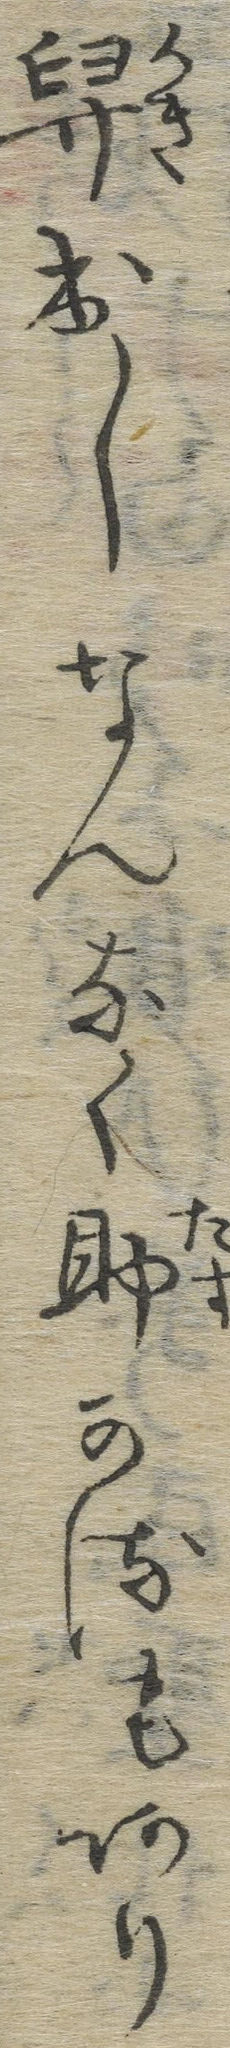舁出しなんなく助かるもあり
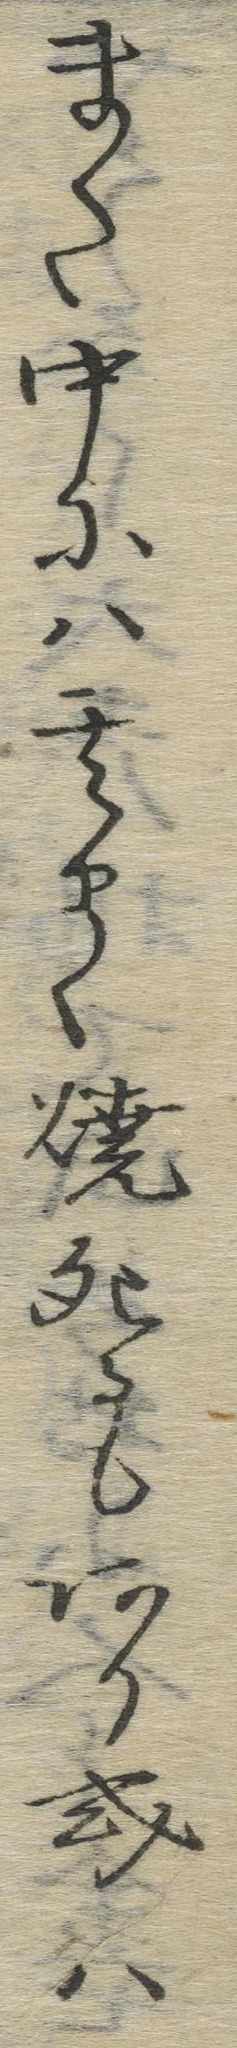また中には其まゝ焼死るもあり或は
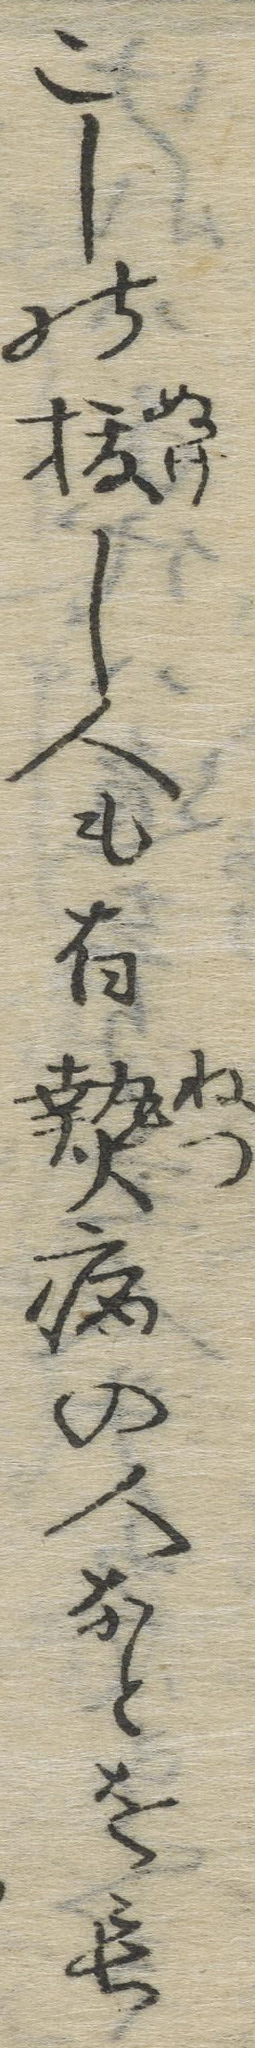こしの抜し人も有熱病の人などを長
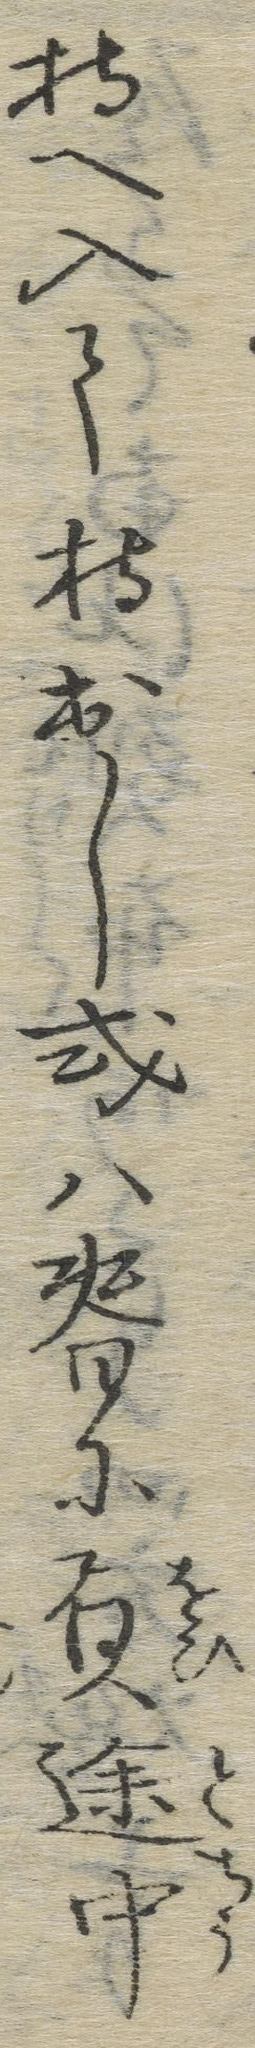持へ入て持出し或は背に負途中
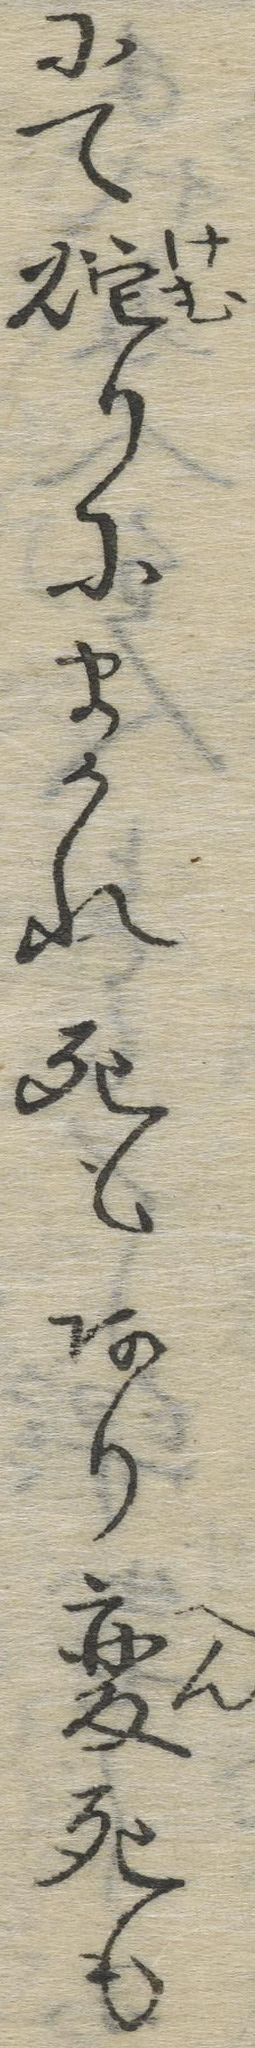にて煙りにまかれ死もあり変死も
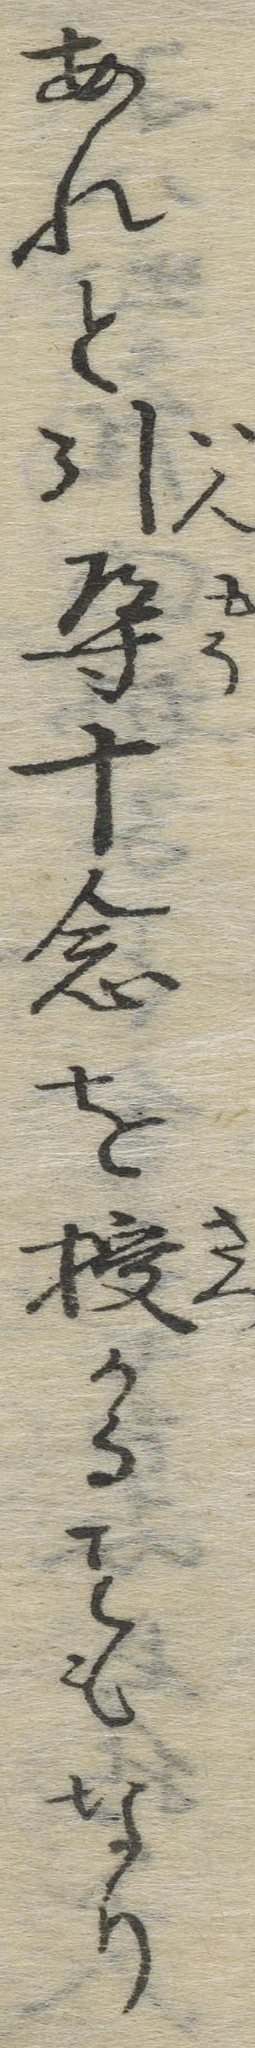あれと引導十念を授かることもなり
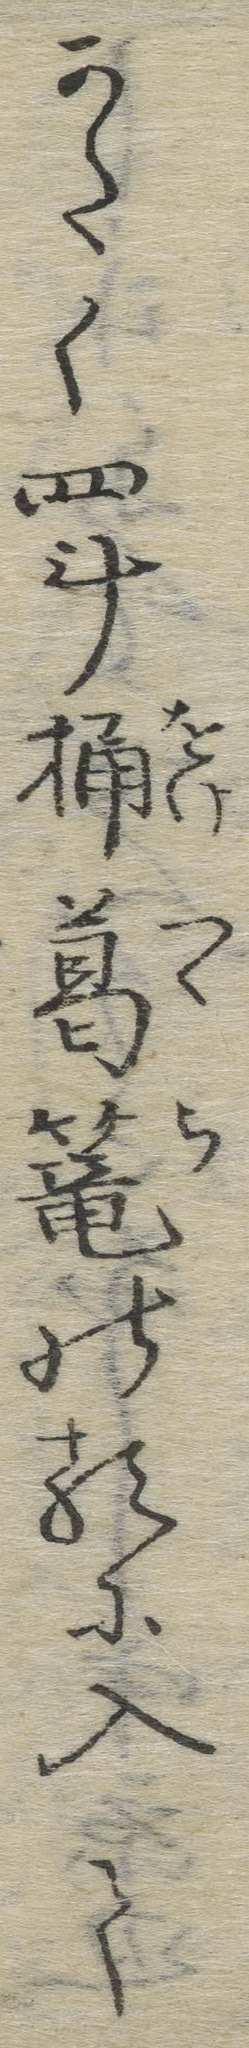かたく四斗桶葛篭の類に入て
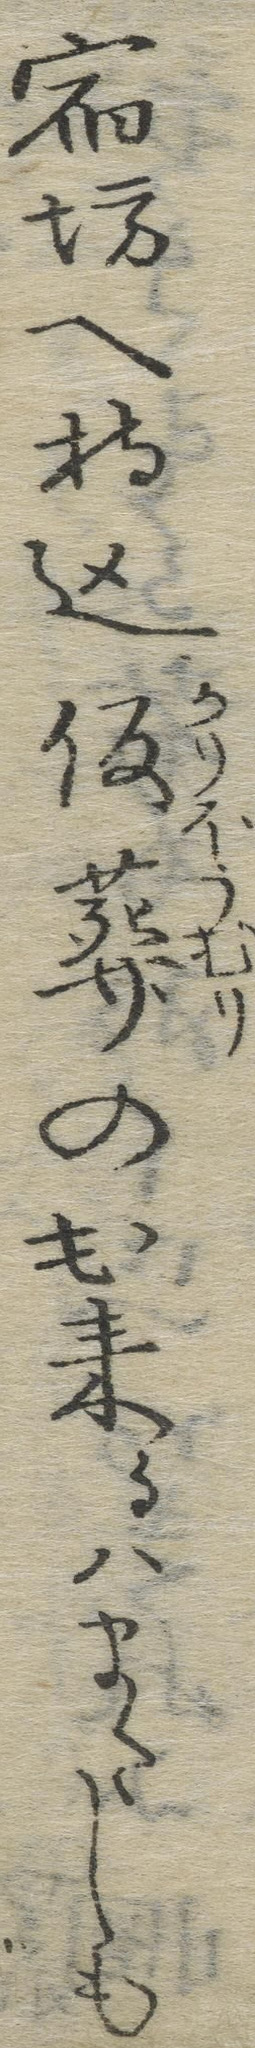宿坊へ持込仮葬の出来るはまたしも
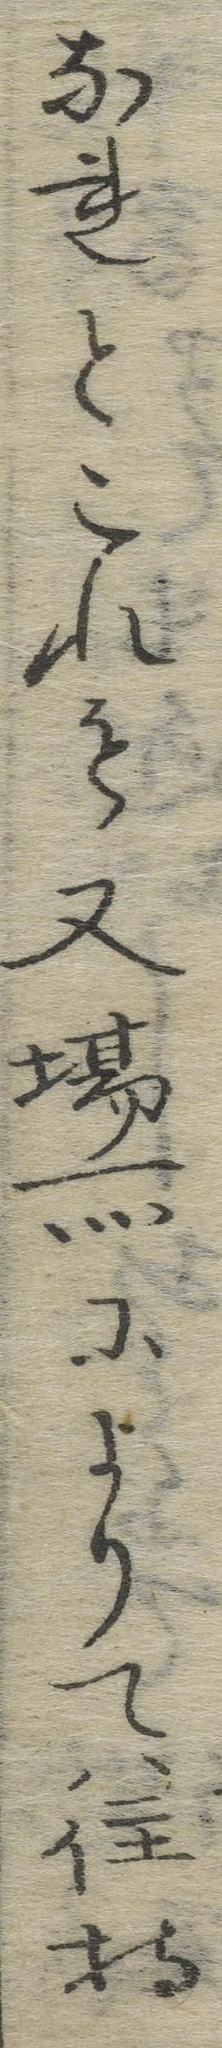なれとこれを又場所によりては住持

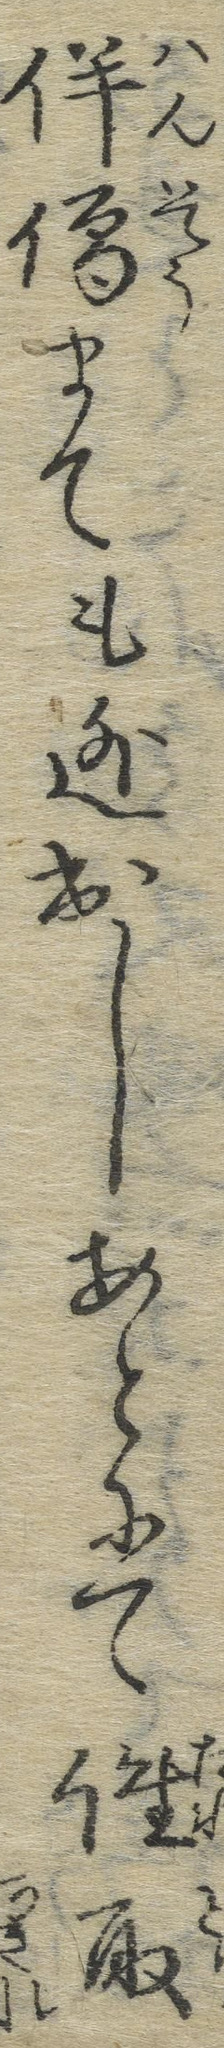伴僧まても逃出ししあとにて誰取
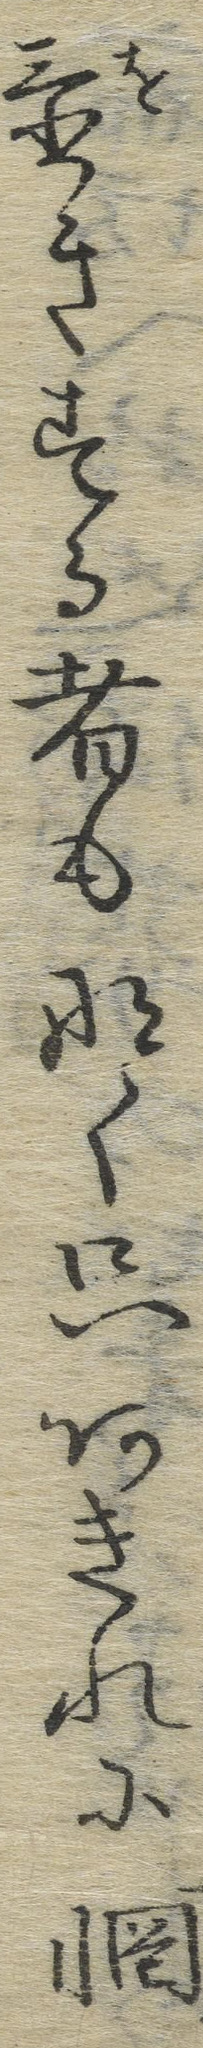置きする者もなく只あきれに惘
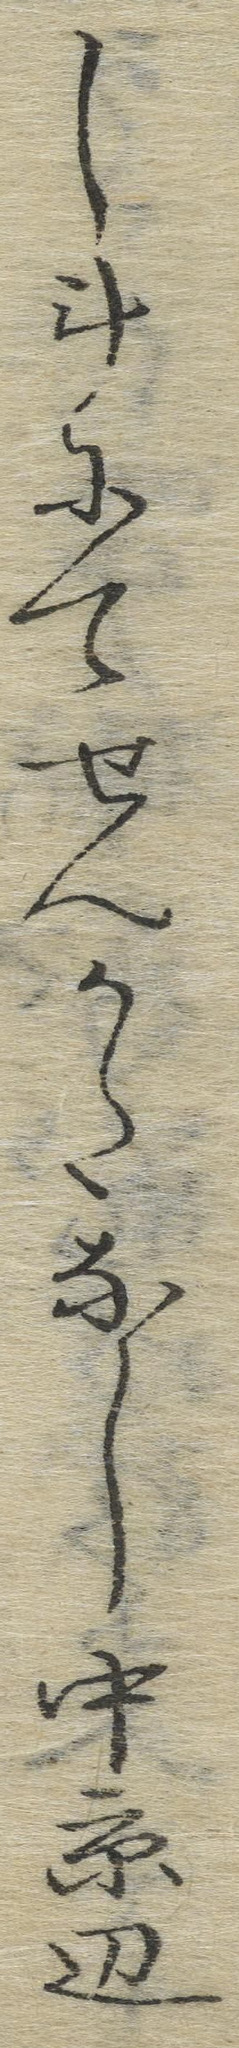し斗にてせんかたなし中京辺
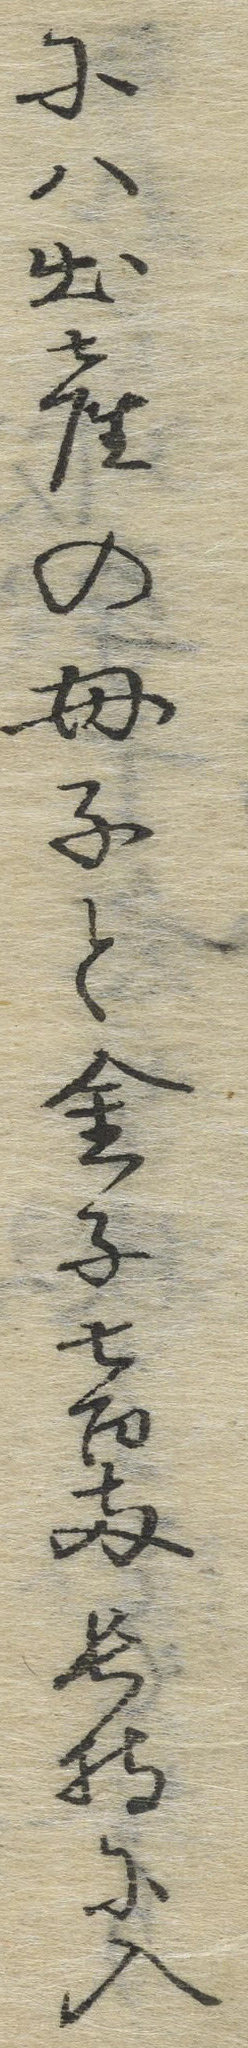には出産の母子と金子七百両長持に入
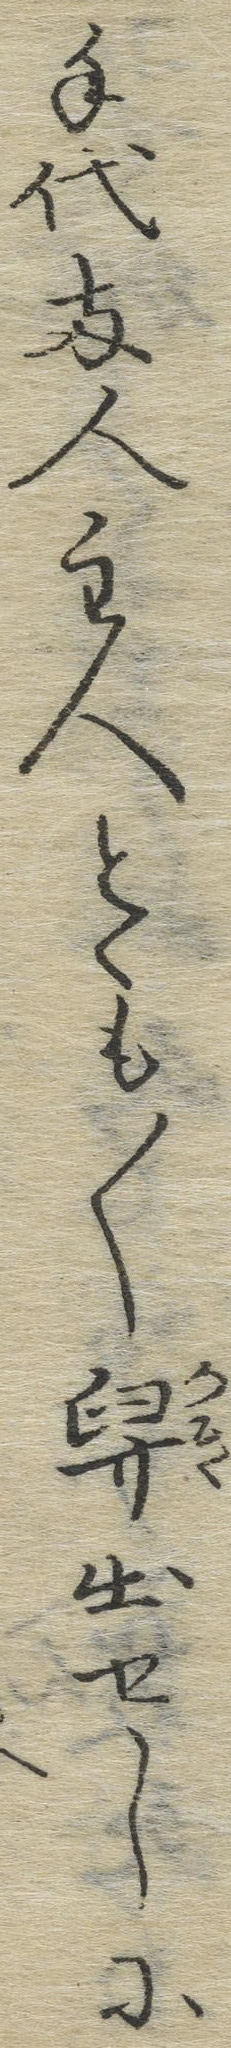手代両人主人とも〳〵舁出せしに
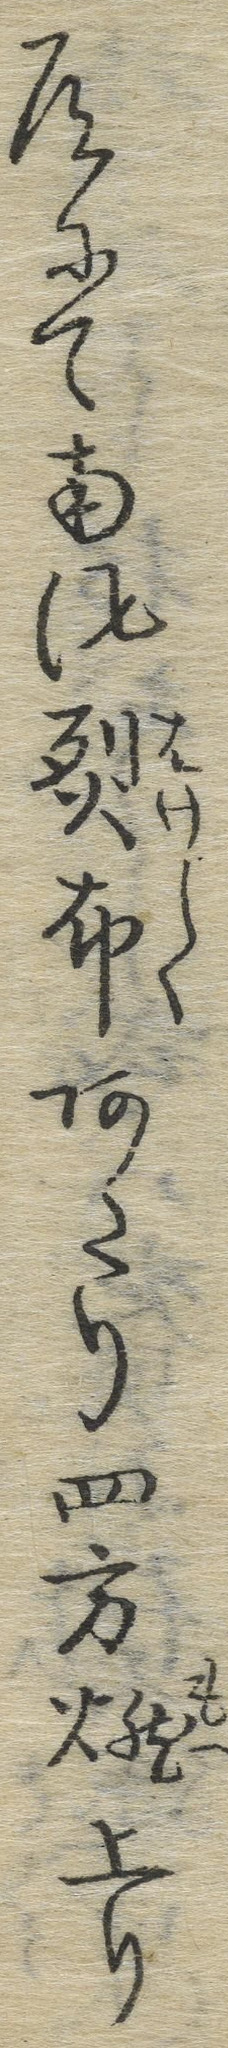道にて南風烈布あたり四方燃上り
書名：あきの日照
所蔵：東京大学地震研究所図書室 Earthquake Research Institute Library, The University of Tokyo, JAPAN
